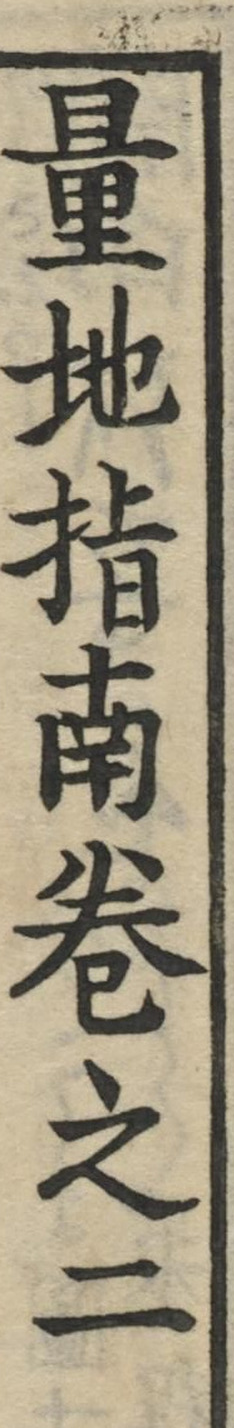量地指南巻之ニ
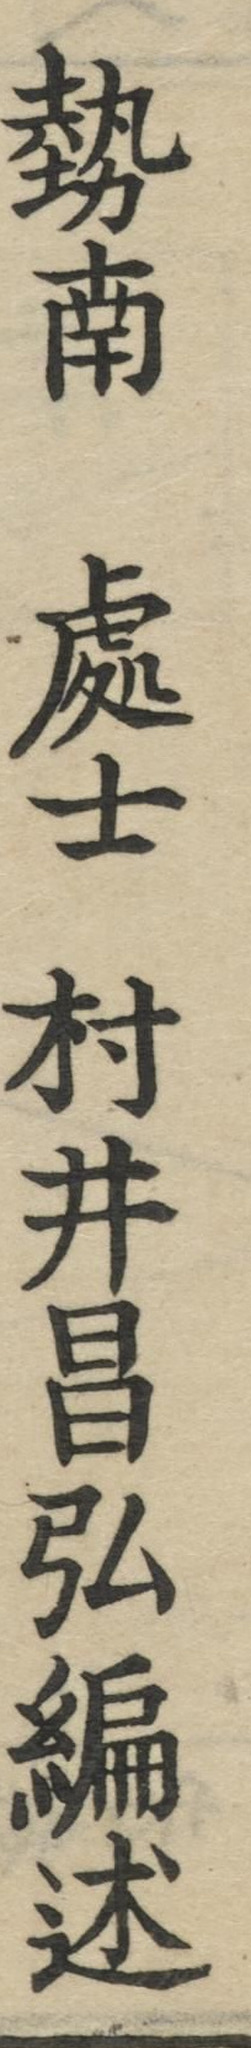勢南處士村井昌弘編述
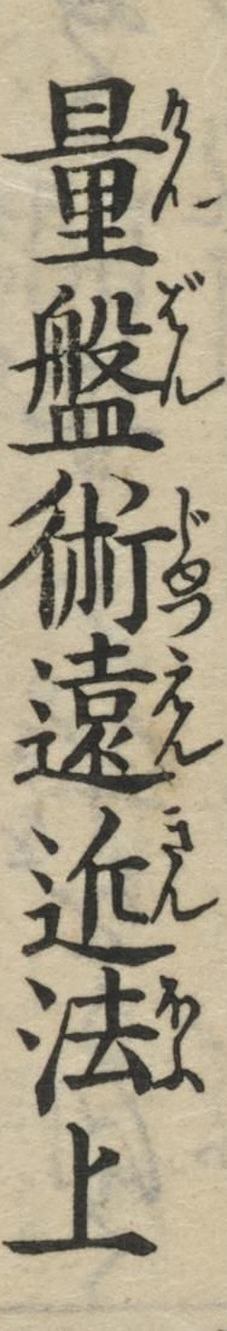量盤術遠近法上
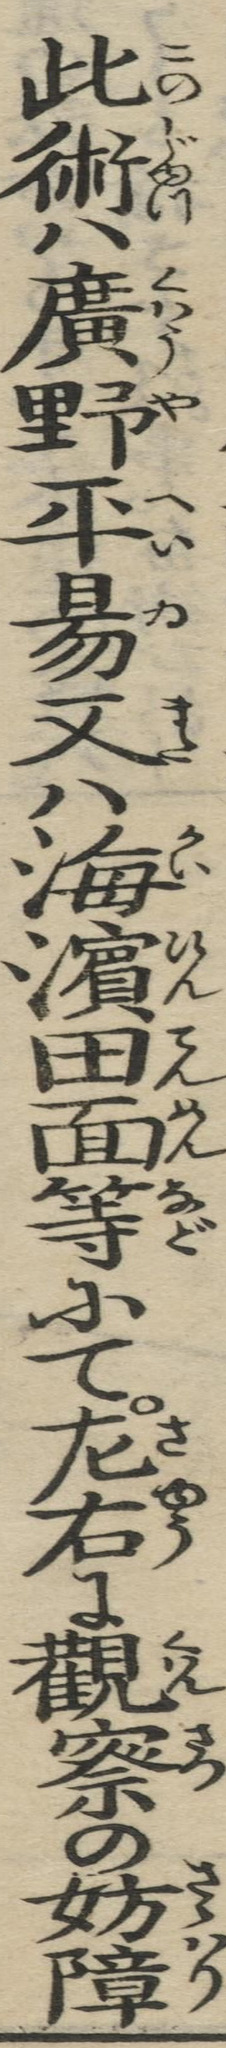此術は廣野平易又は海濱田面等にて。左右に觀察の妨害
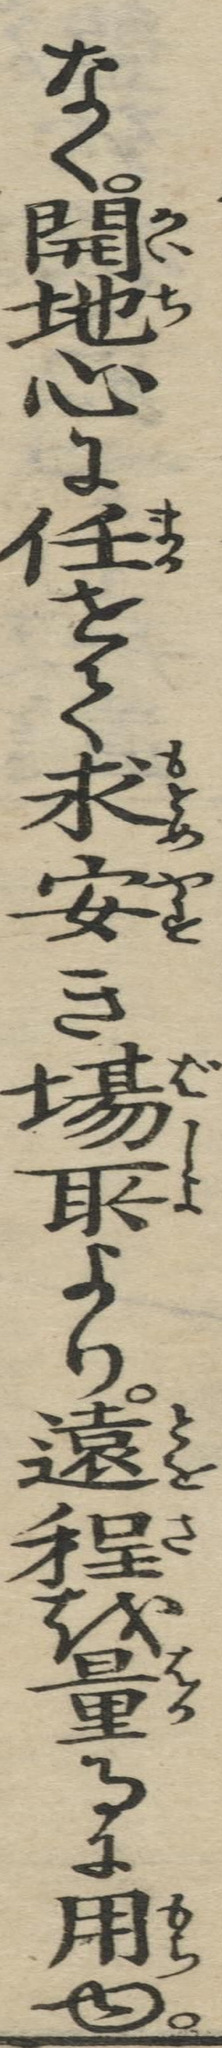なく。開地心に任せて求安き場所より。遠程を量るに用ゆ。
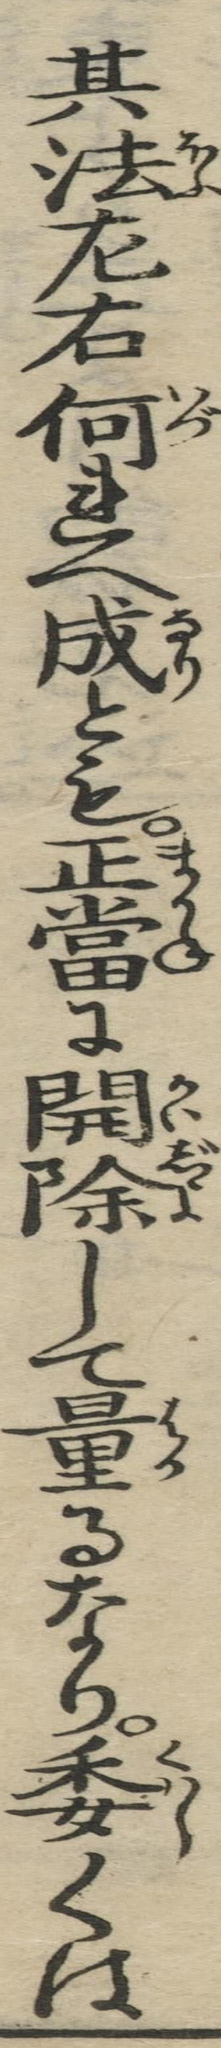其法左右何れへ成とも。正當に開除して量るなり。委くは
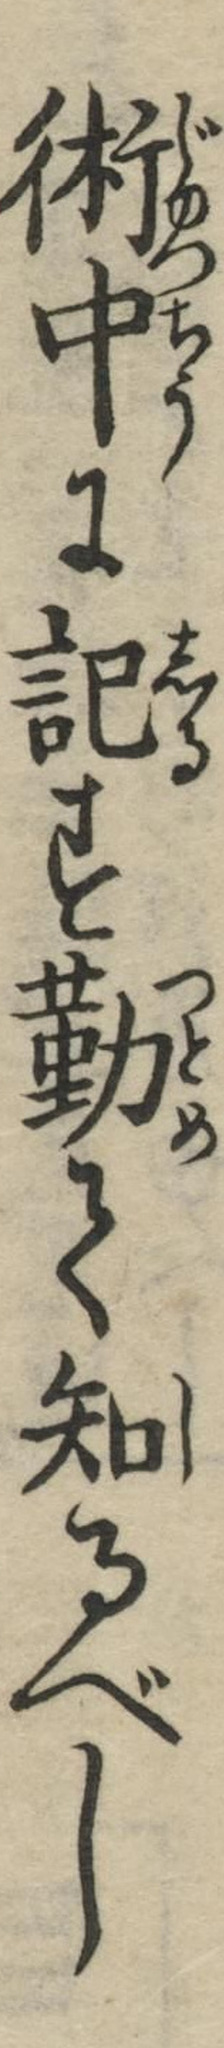術中に記す勤て知るべし
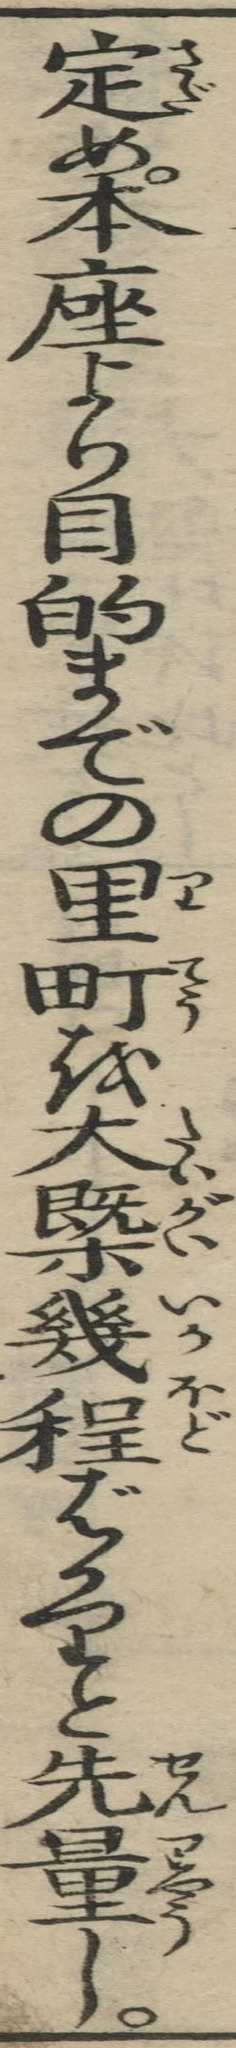定め。本座より目的までの里町を大槩幾程ばかりと先量し。

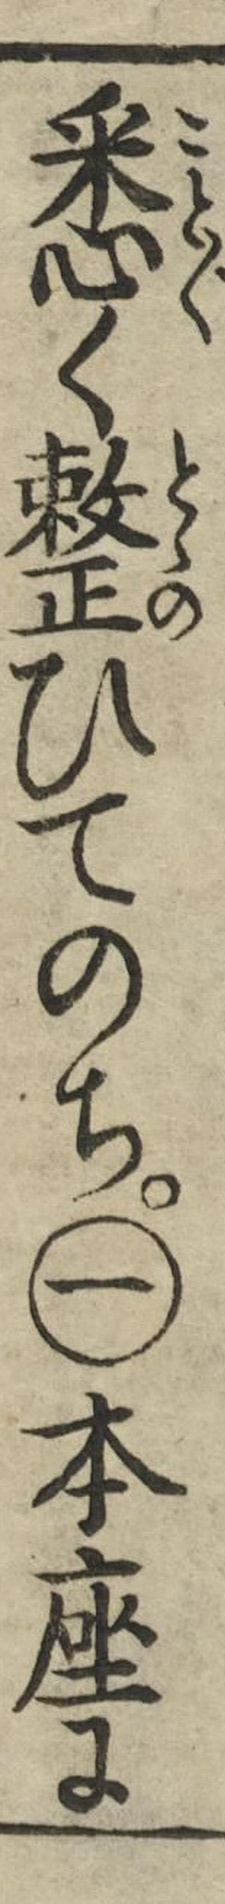悉く整ひてのち。㊀本座に
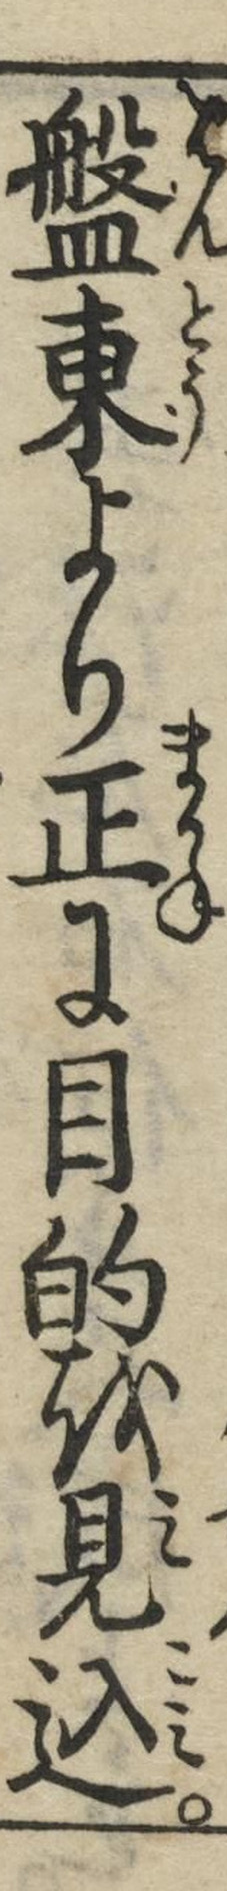盤東より正に目的を見込。
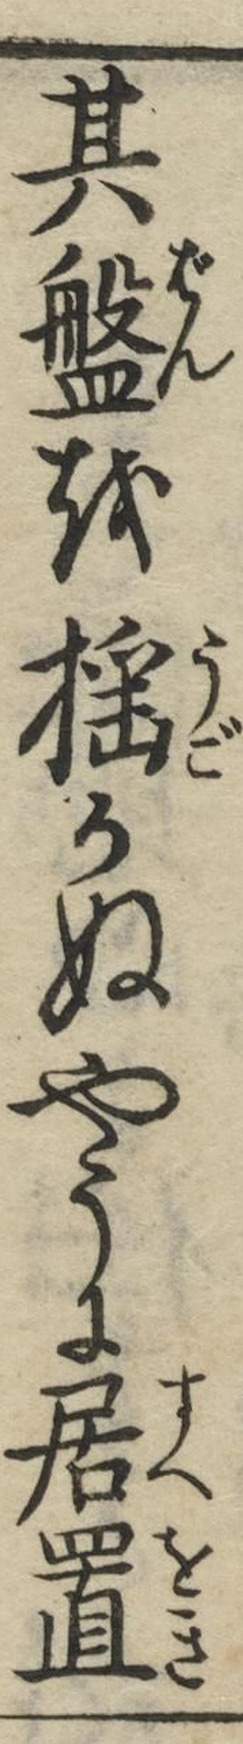其盤を揺かぬやうに居置
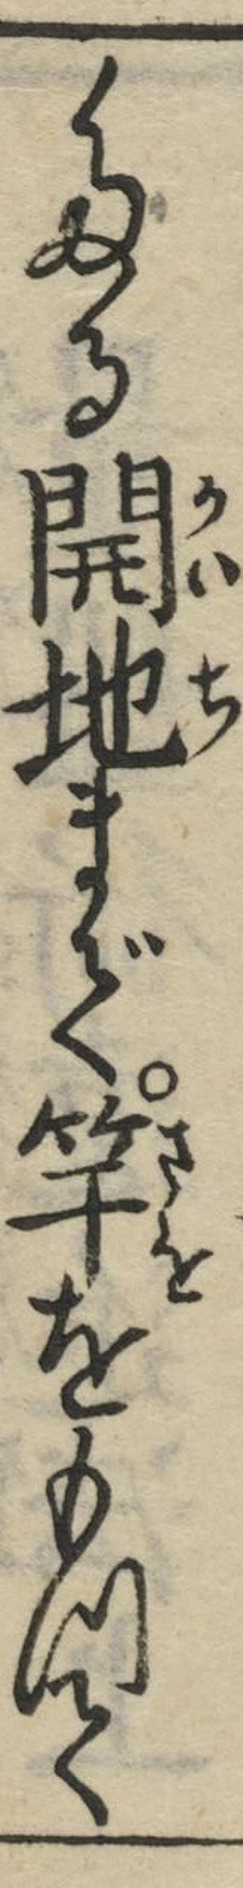たる開地まで。竿をもつて
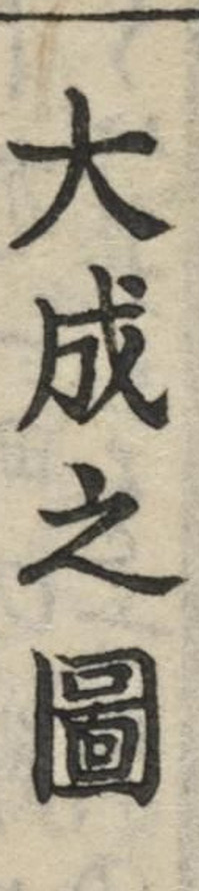大成之図
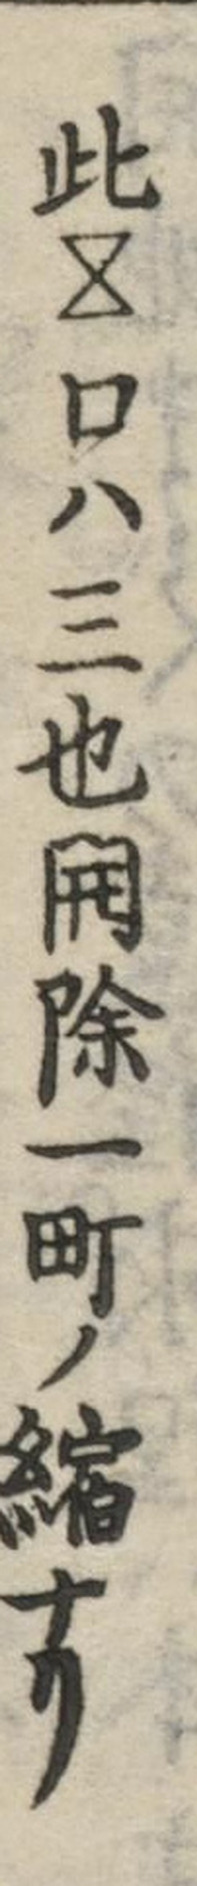此▽△口ハ三也開除一町ノ縮ナリ
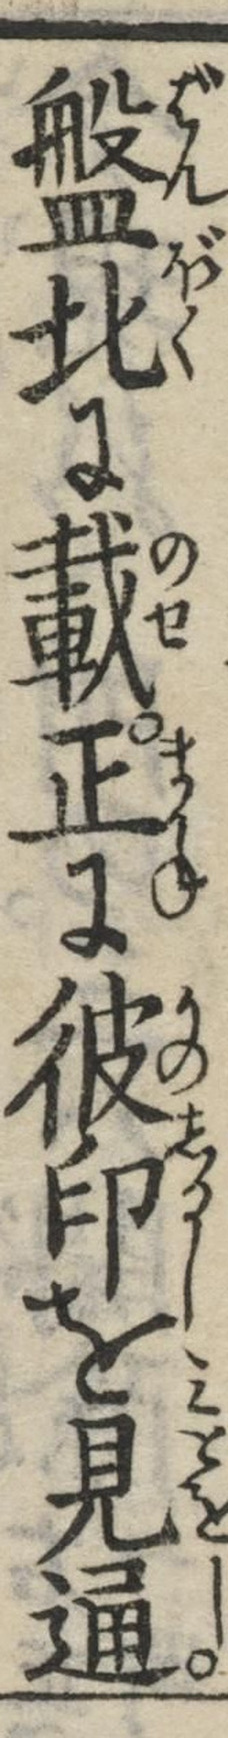盤北に載。正に彼印を見通。
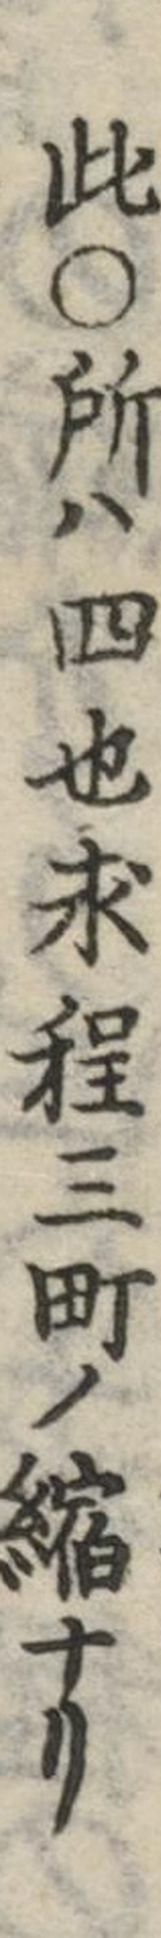此○所ハ四也求程三町ノ縮ナリ
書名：量地指南　巻之二（内題）
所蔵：東京大学地震研究所図書室 Earthquake Research Institute Library, The University of Tokyo, JAPAN
